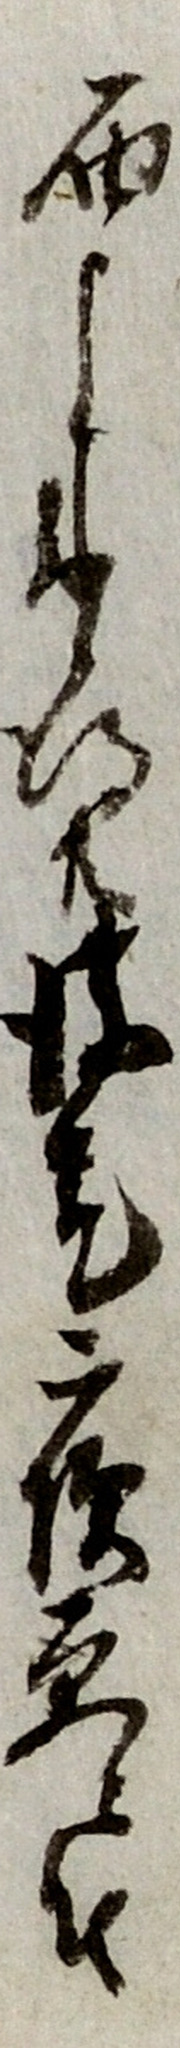届申来候得共彼是夜更ニ付
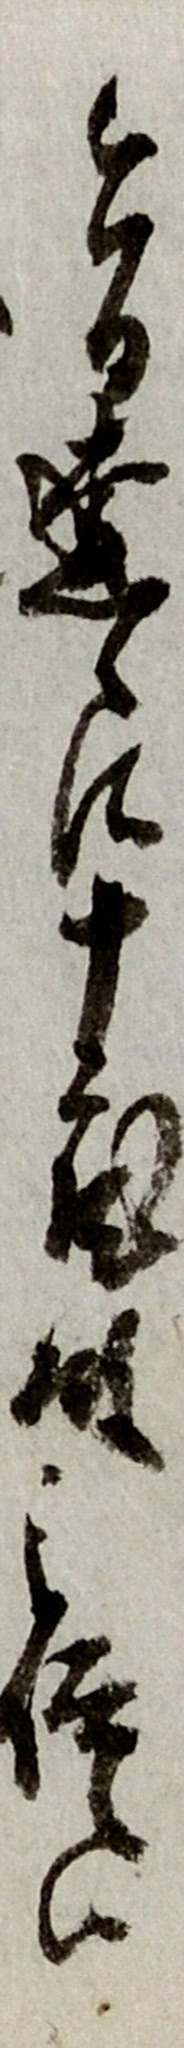今日達候様十蔵殿被仰候付
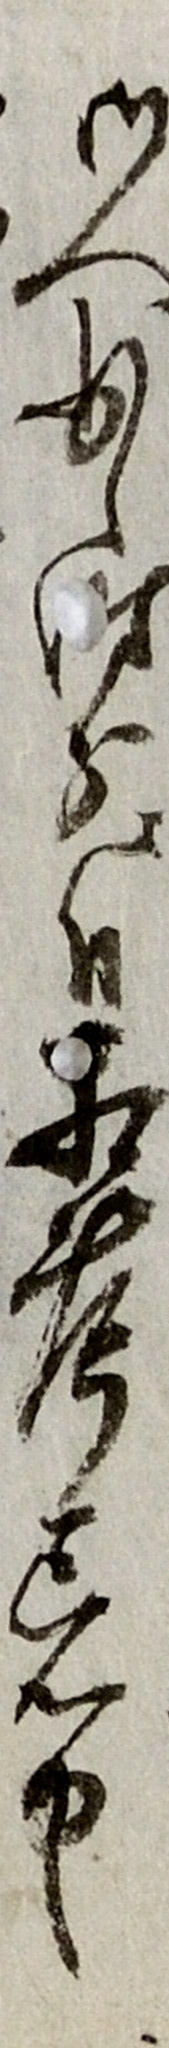御人出候時分ニ付相考着申
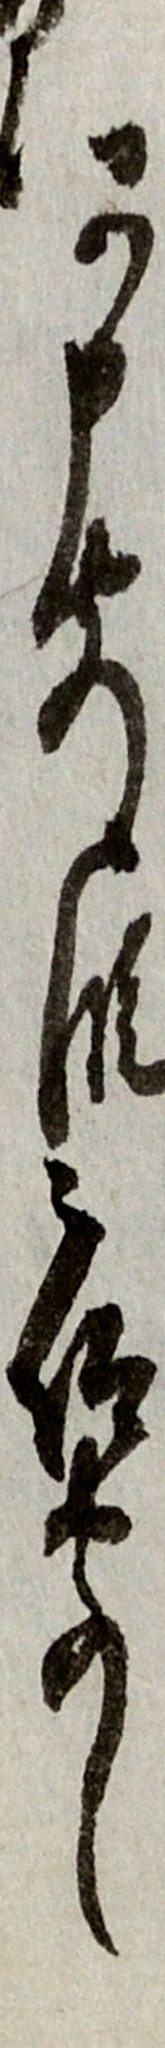可申聞候段被仰聞候
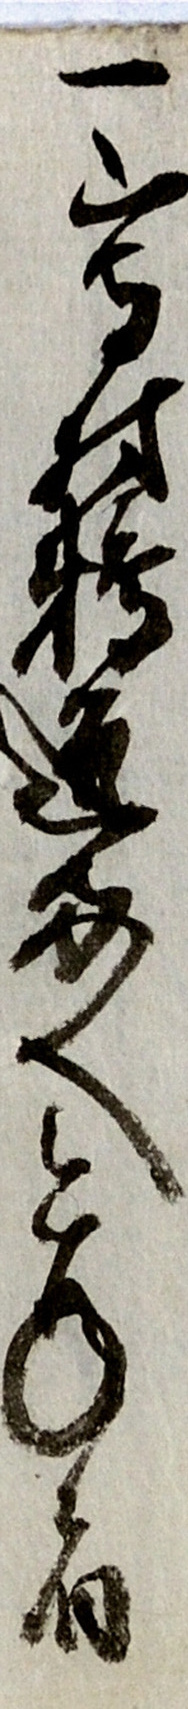一山寺村鵜匠両人今年は
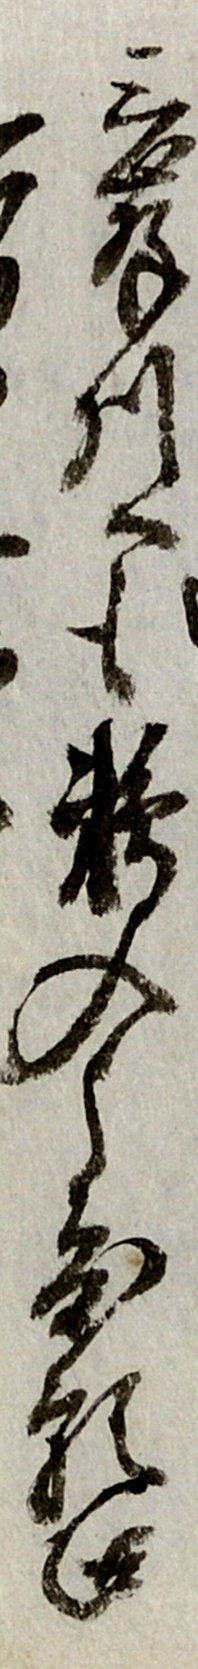三峰川へも鵜入申度願趣
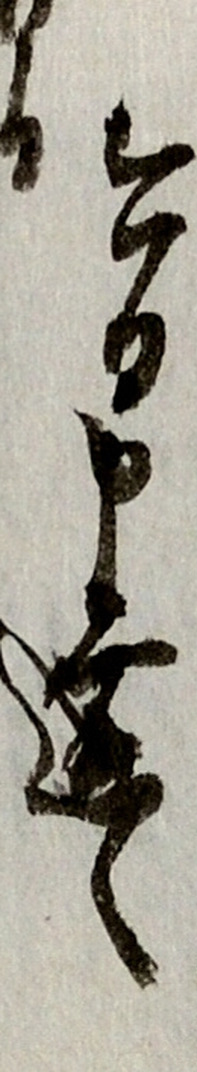今日申達候
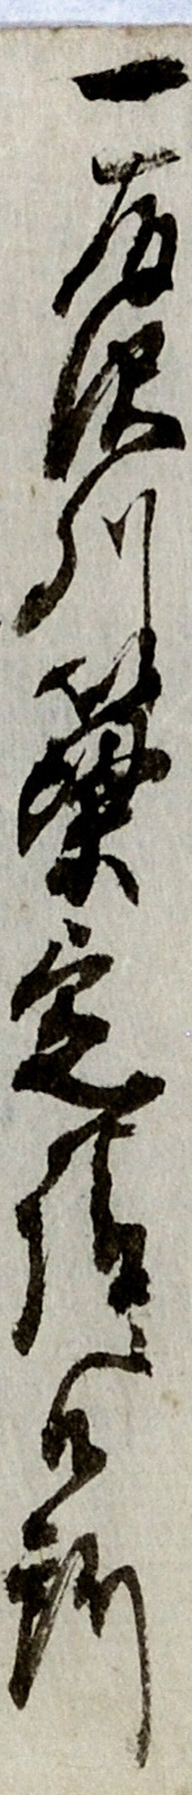一藤沢川築定請に候所
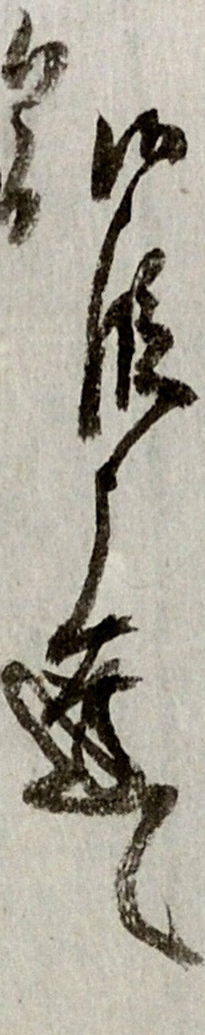候段申達候
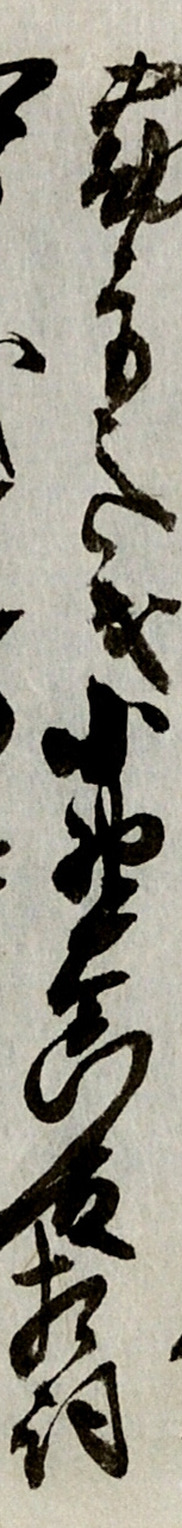勤方之義小野右衛門殿相伺
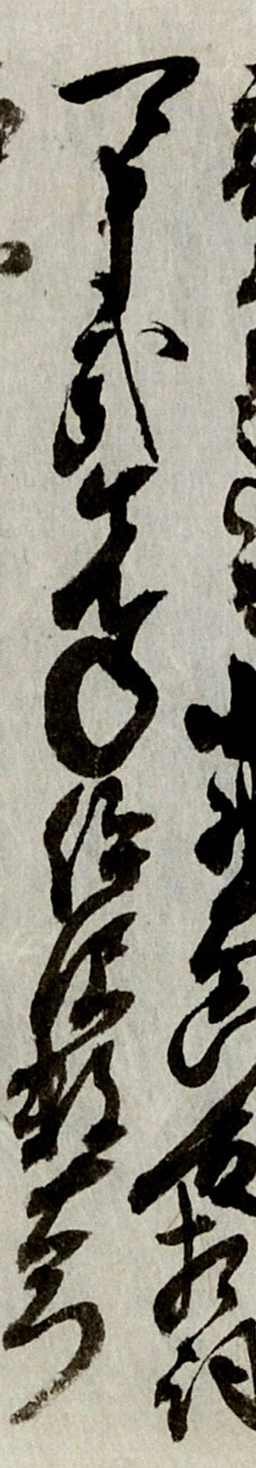可申候哉先年伊沢数右衛門
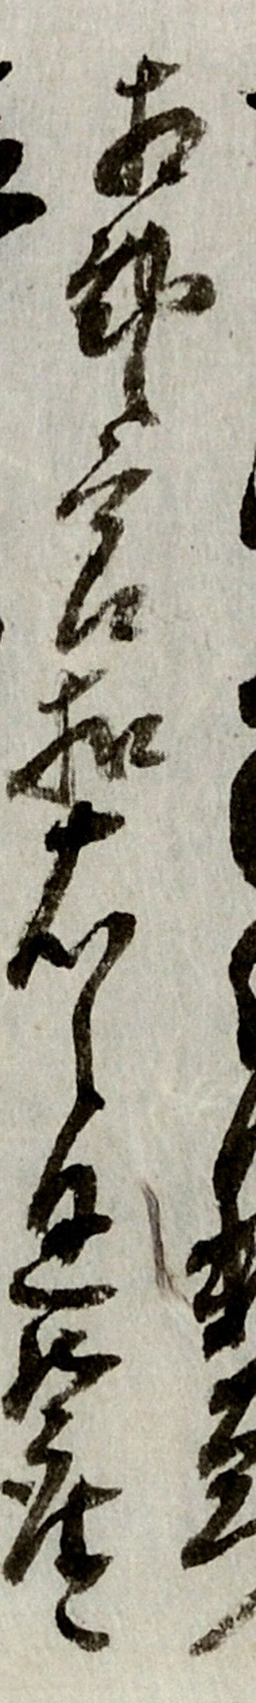相勤候節扣右之通御座候
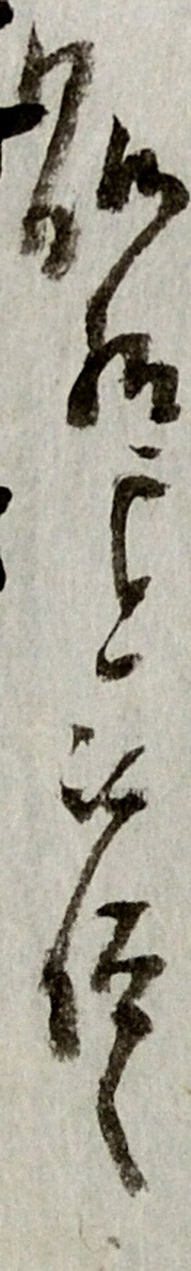候様ニと被仰候
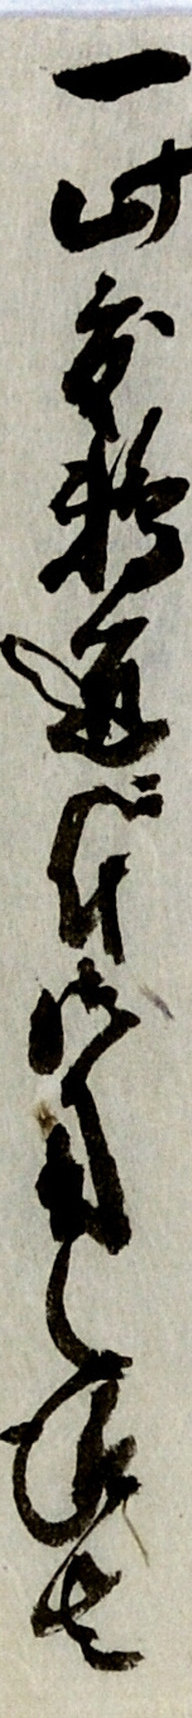一此度鵜匠ニ付御用之趣は
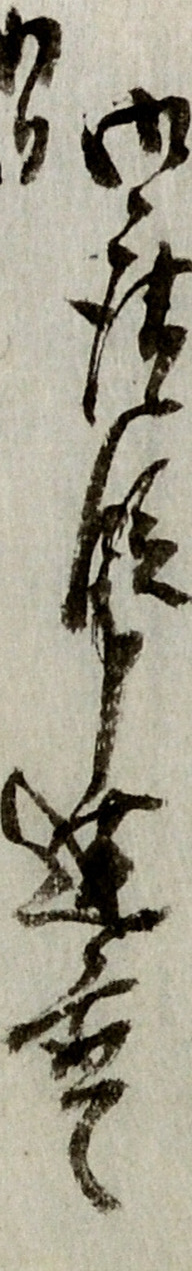御座候段申達置候
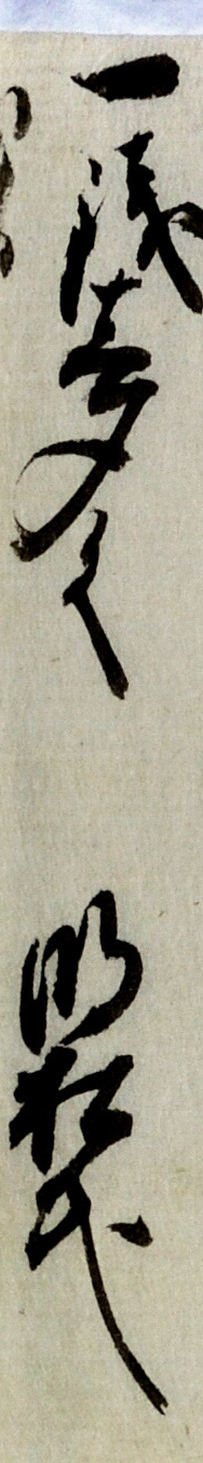一銭壱貫文明松代
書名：分一方諸事御用留帳
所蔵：伊那市立高遠町図書館・合同会社AMANE
